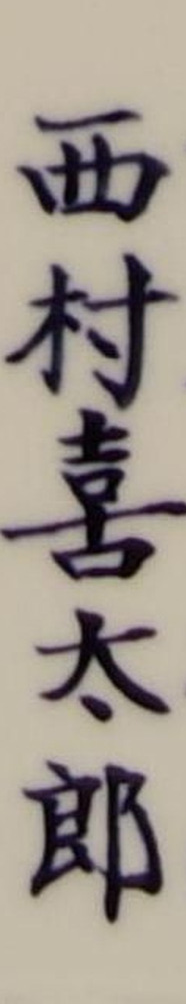西村喜太郎
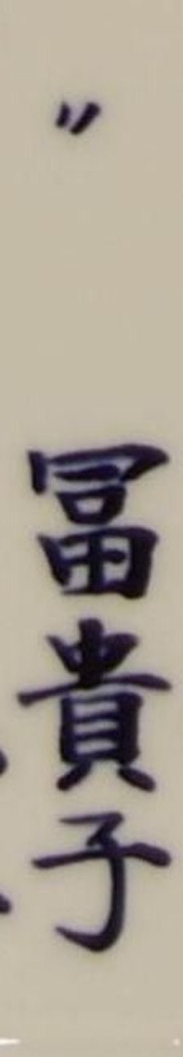冨貴子
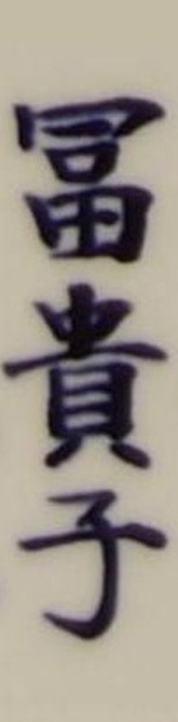冨貴子
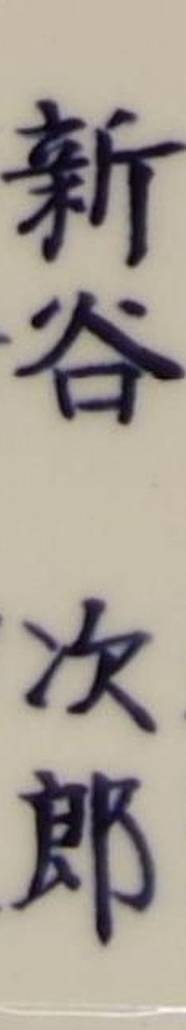新谷次郎
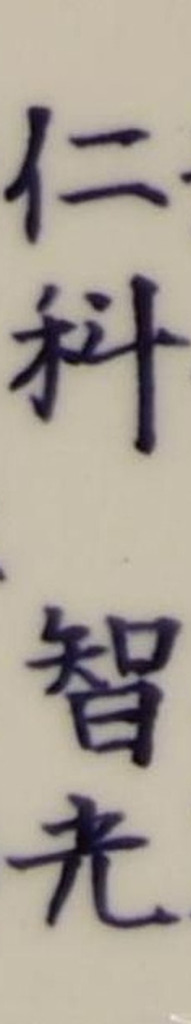仁科智光
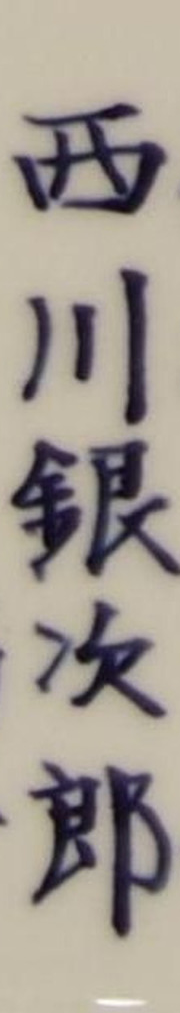西川銀次郎
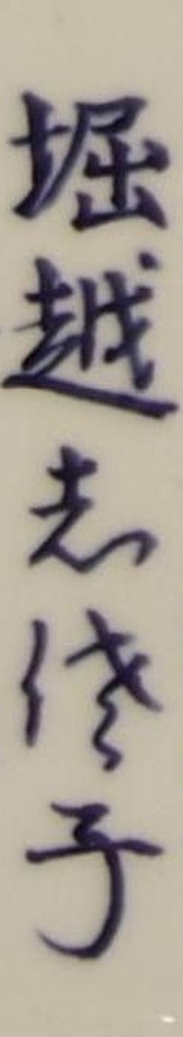堀越しさ子
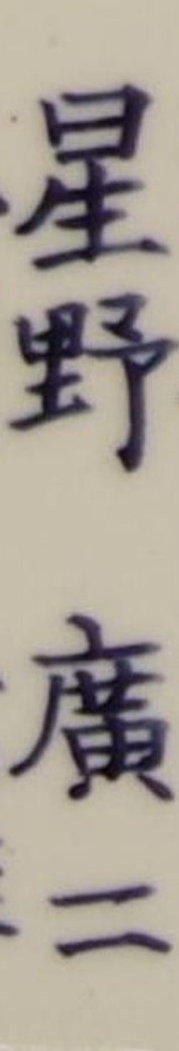星野廣二
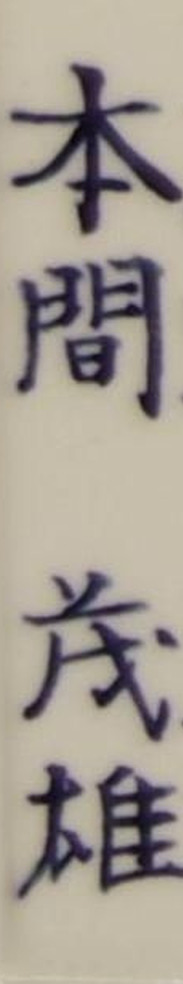本間茂雄

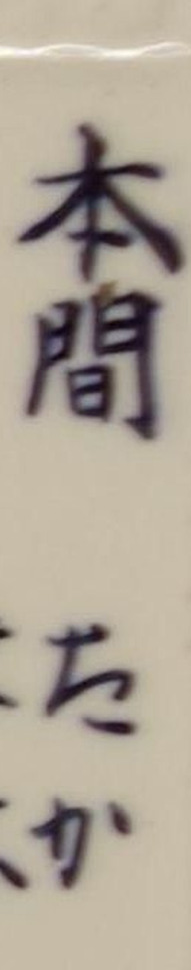本間太か
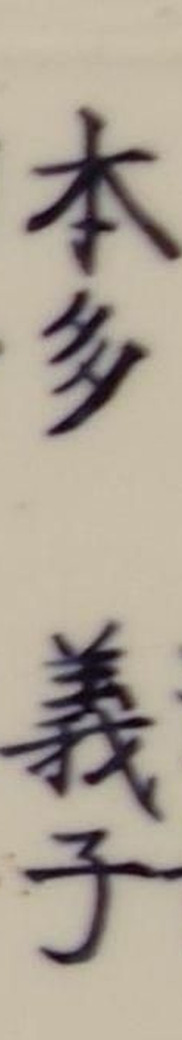本多義子
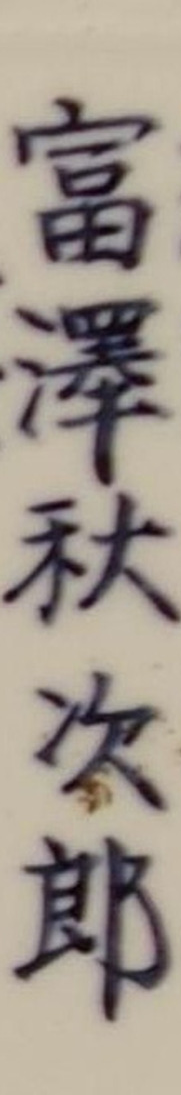富澤秋次郎
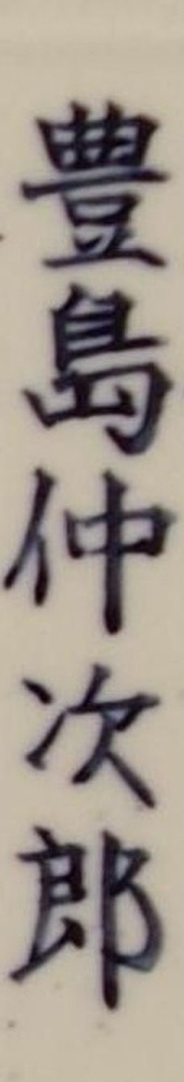豊島仲次郎
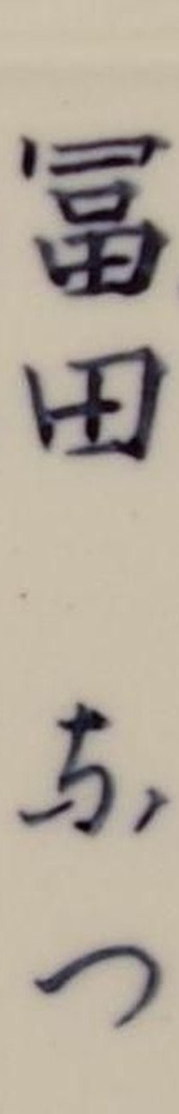冨田なつ
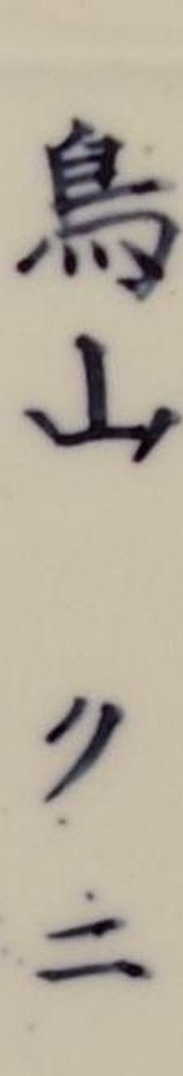鳥山クニ
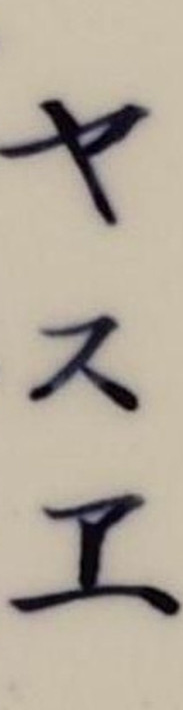ヤスエ
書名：E~L
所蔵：高野山金剛峯寺
